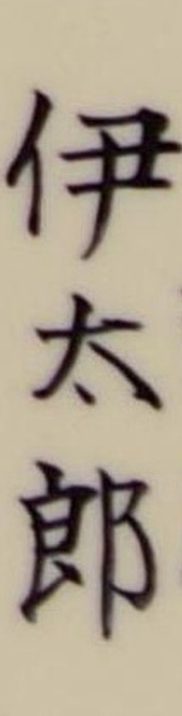伊太郎
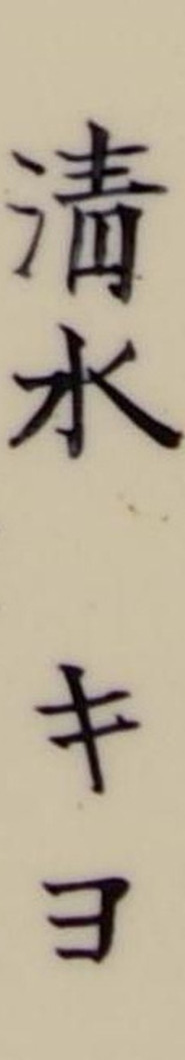清水キヨ
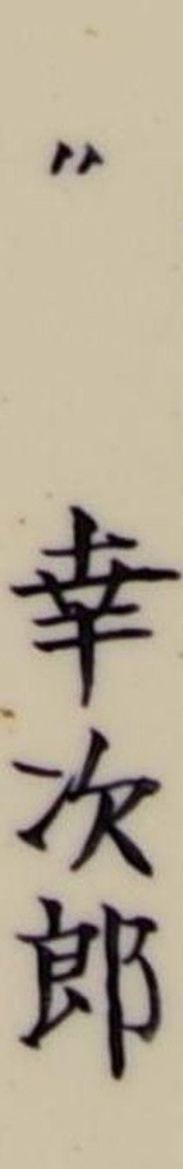幸次郎
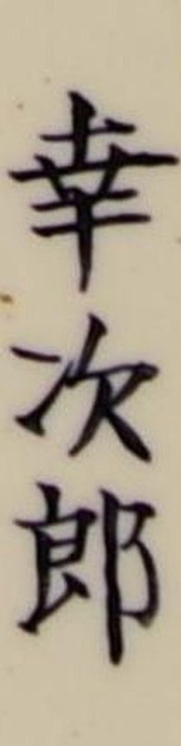幸次郎
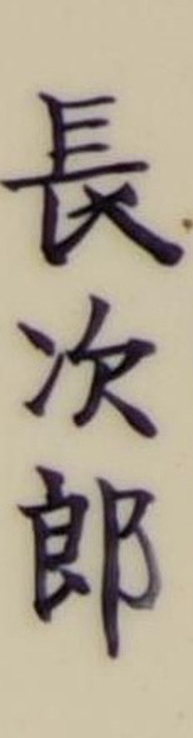長次郎

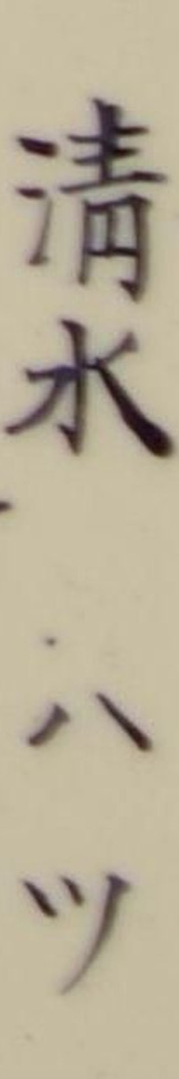清水ハツ
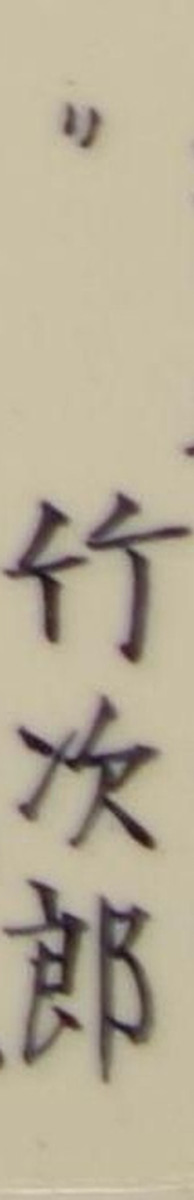竹次郎
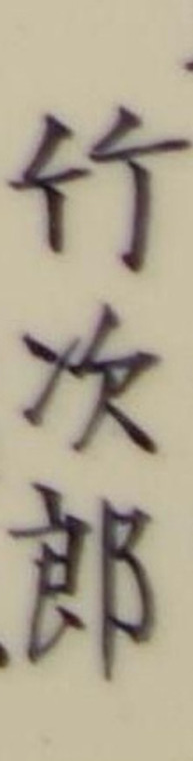竹次郎
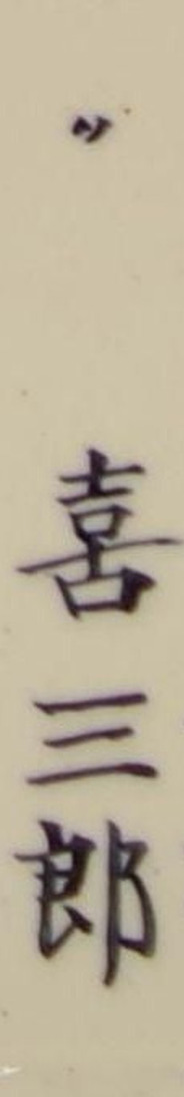喜三郎
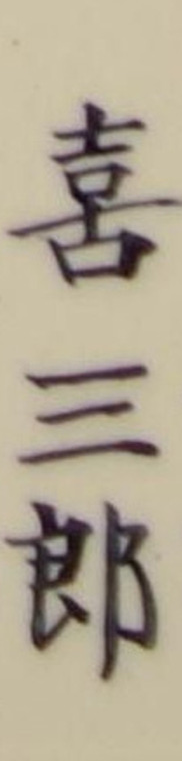喜三郎
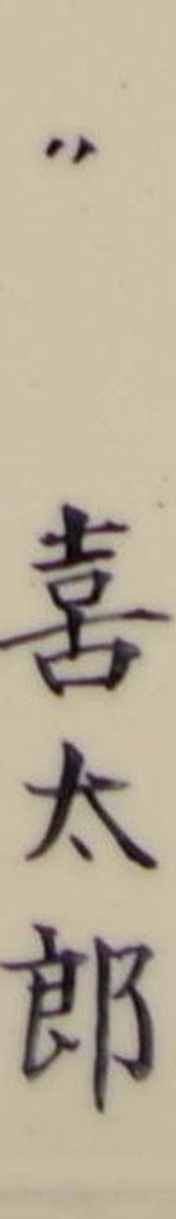喜太郎
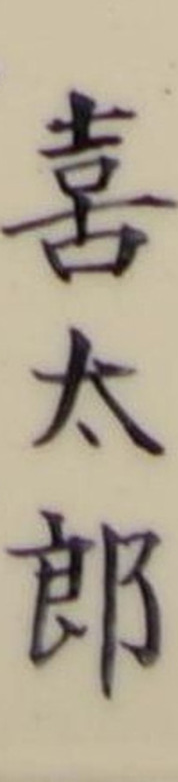喜太郎
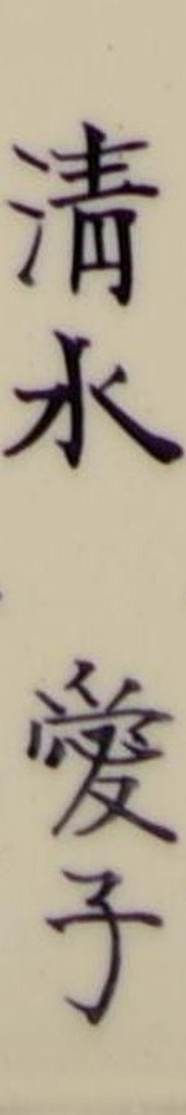清水愛子
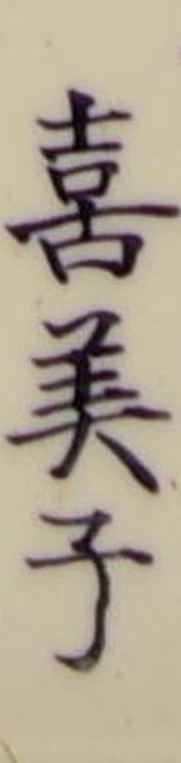喜美子
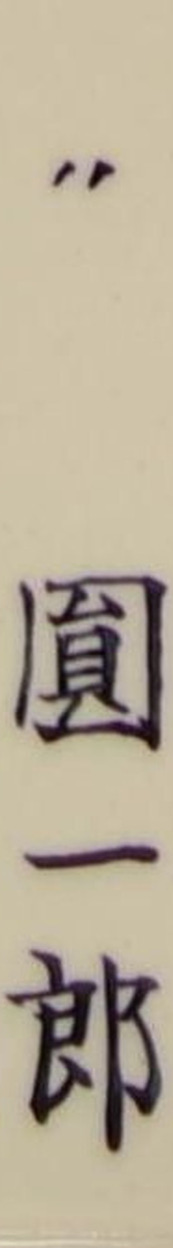圓一郎
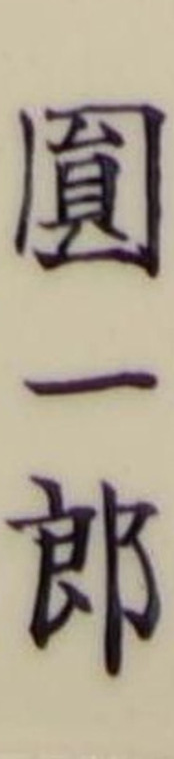圓一郎
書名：E~L
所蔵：高野山金剛峯寺
